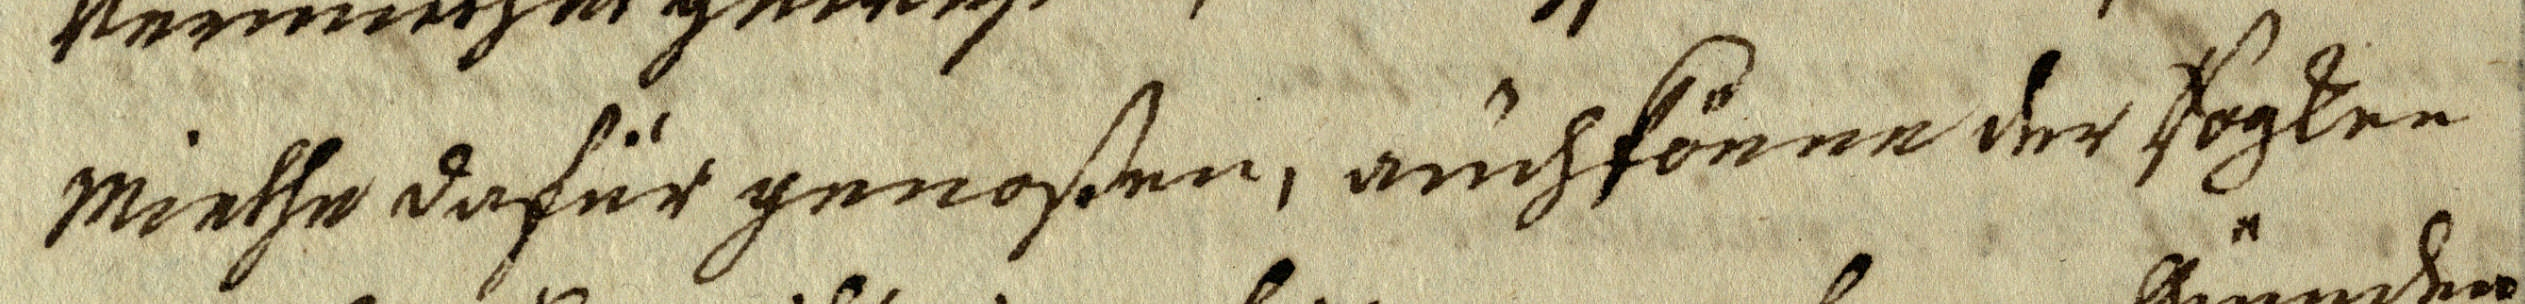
Miethe dafür genoßen, auch könne der Rogken
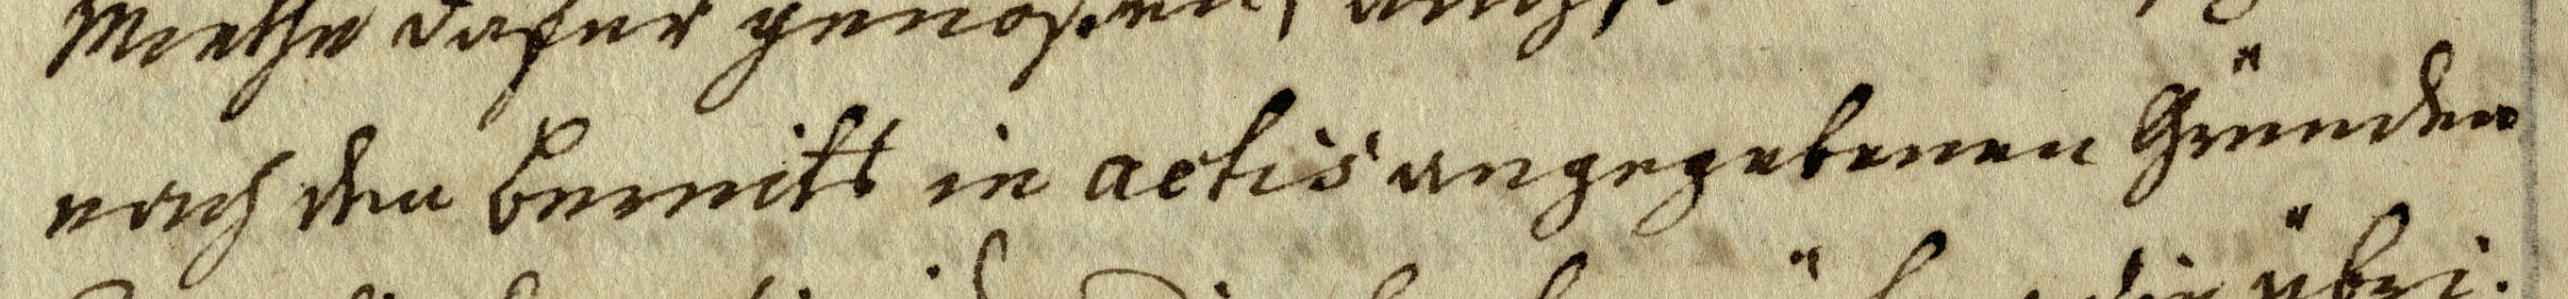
nach dem bereits in actis angegebenen Gründen
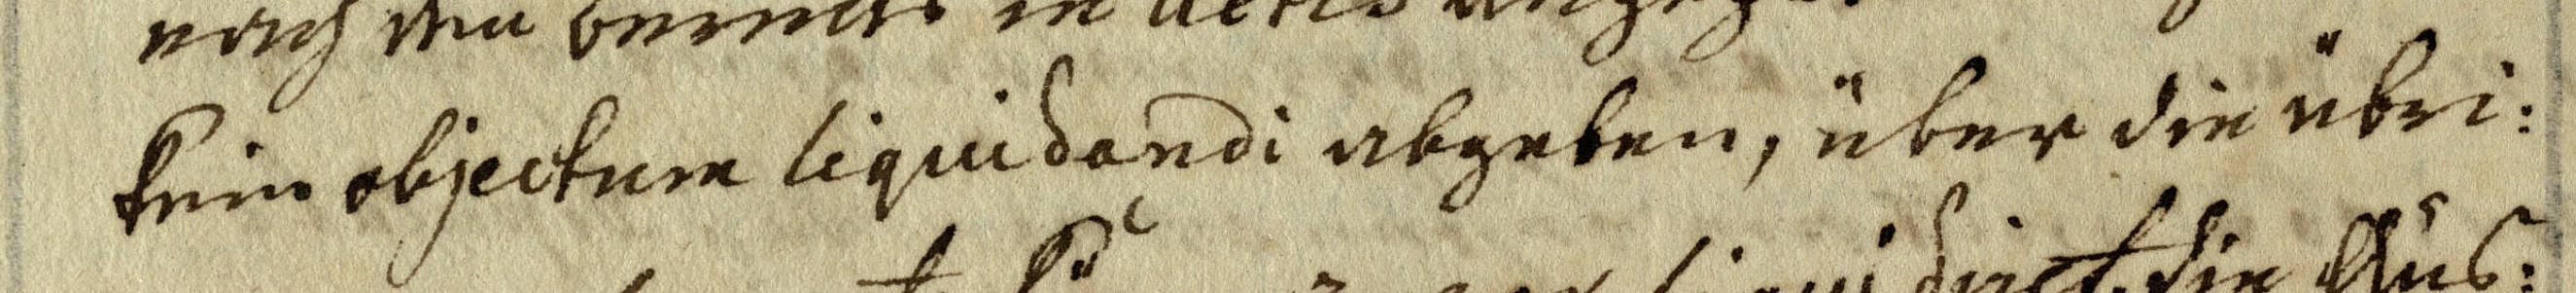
kein objectum liquidandi abgeben, über die übri¬
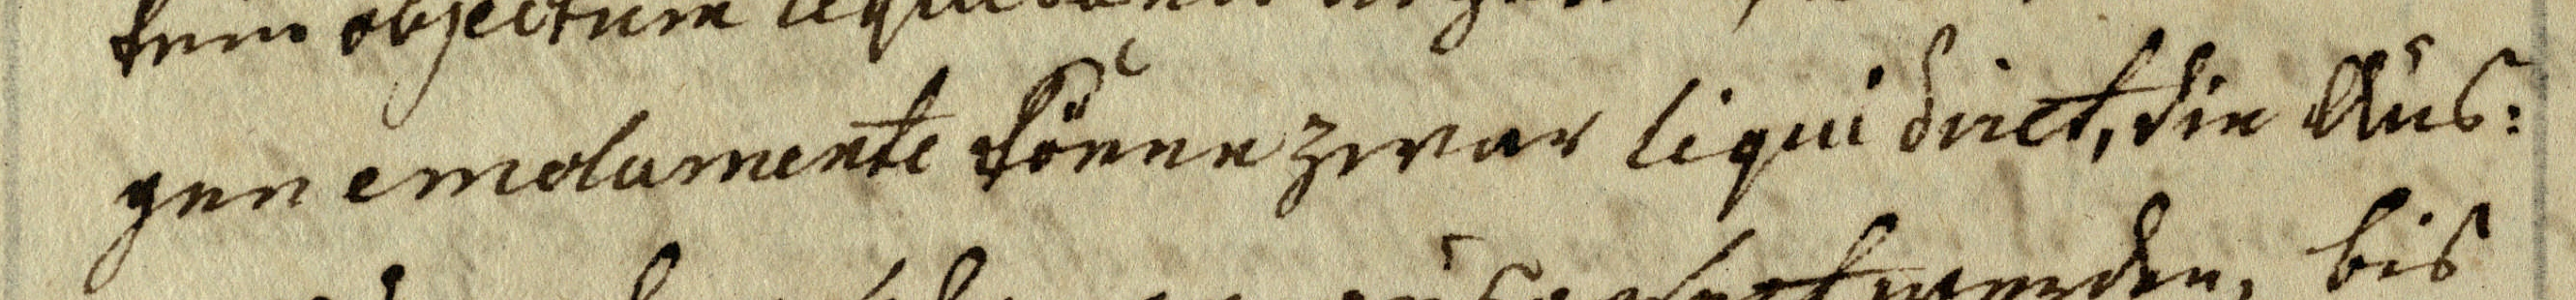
gen emolumente könne zwar liquidiret , die Aus¬
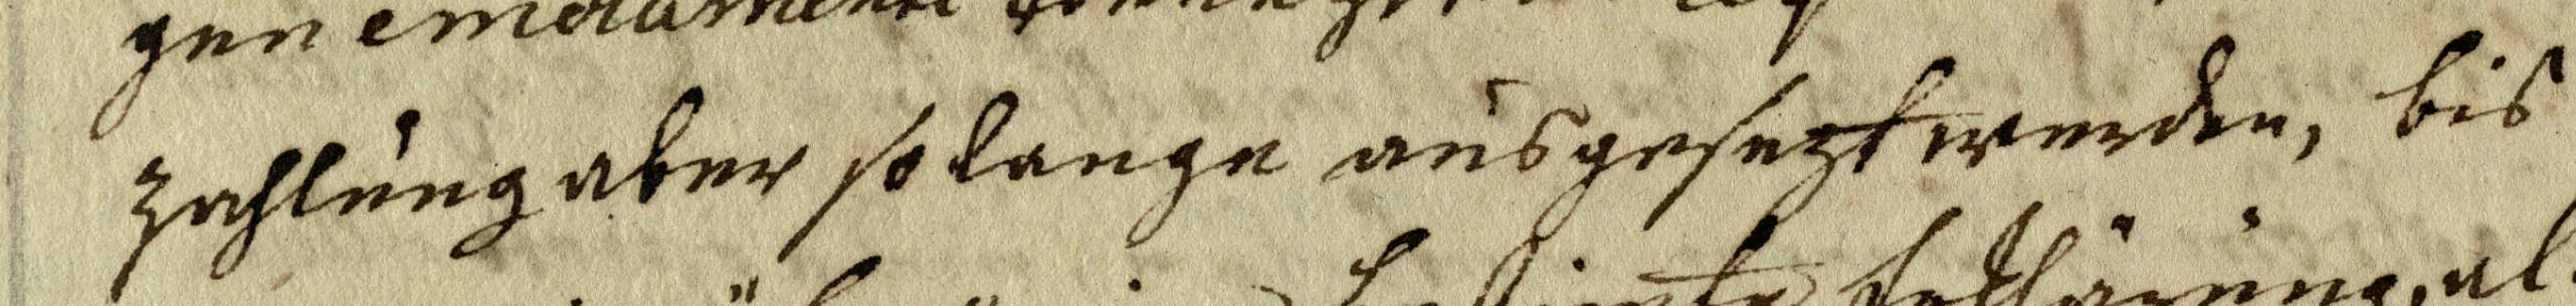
zahlung aber so lange ausgesezt werden, bis
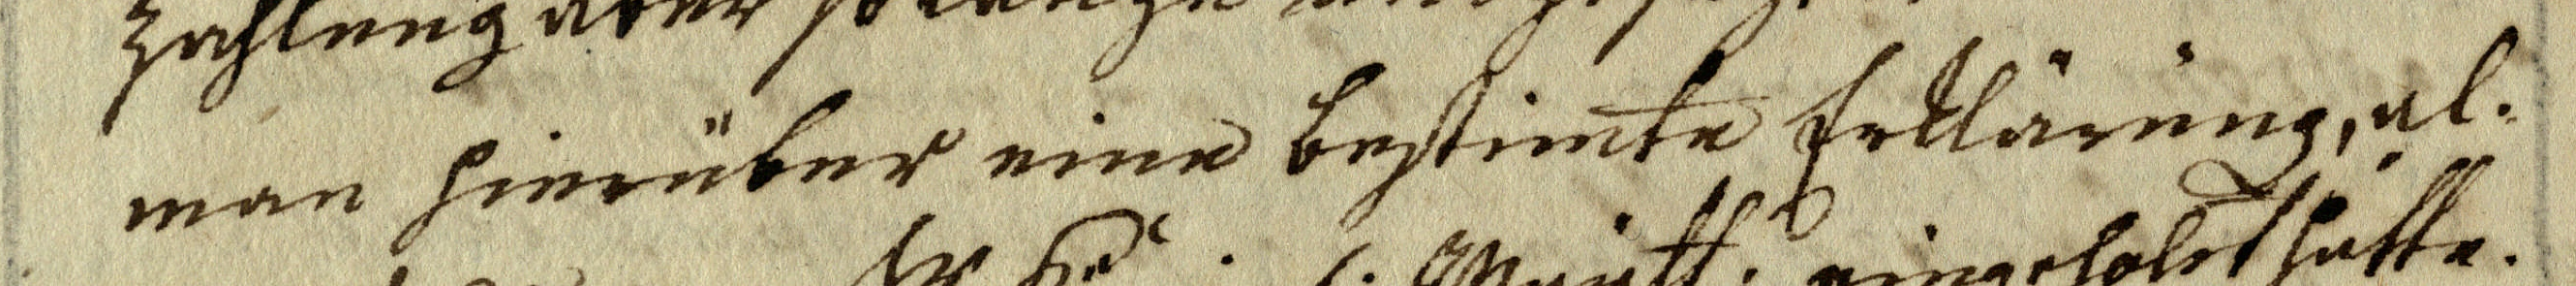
man hierüber eine bestimte Erklärung, al¬
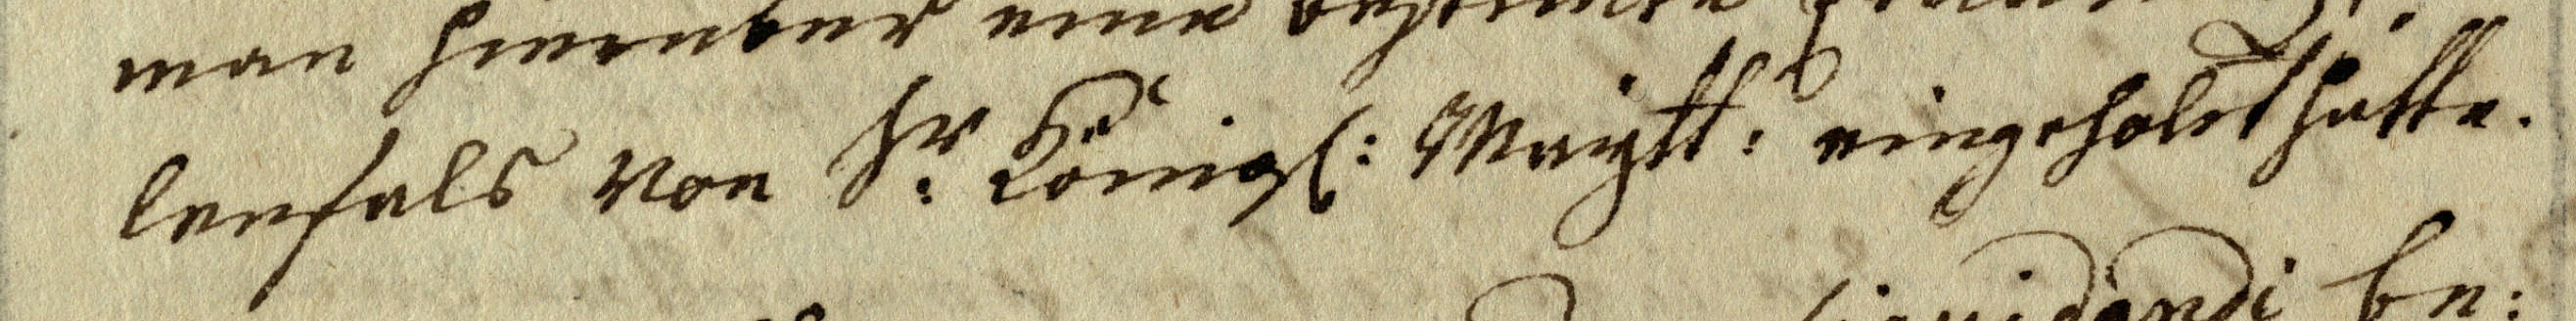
lenfals von Sr Königl. Maÿtt. eingeholet hätte.
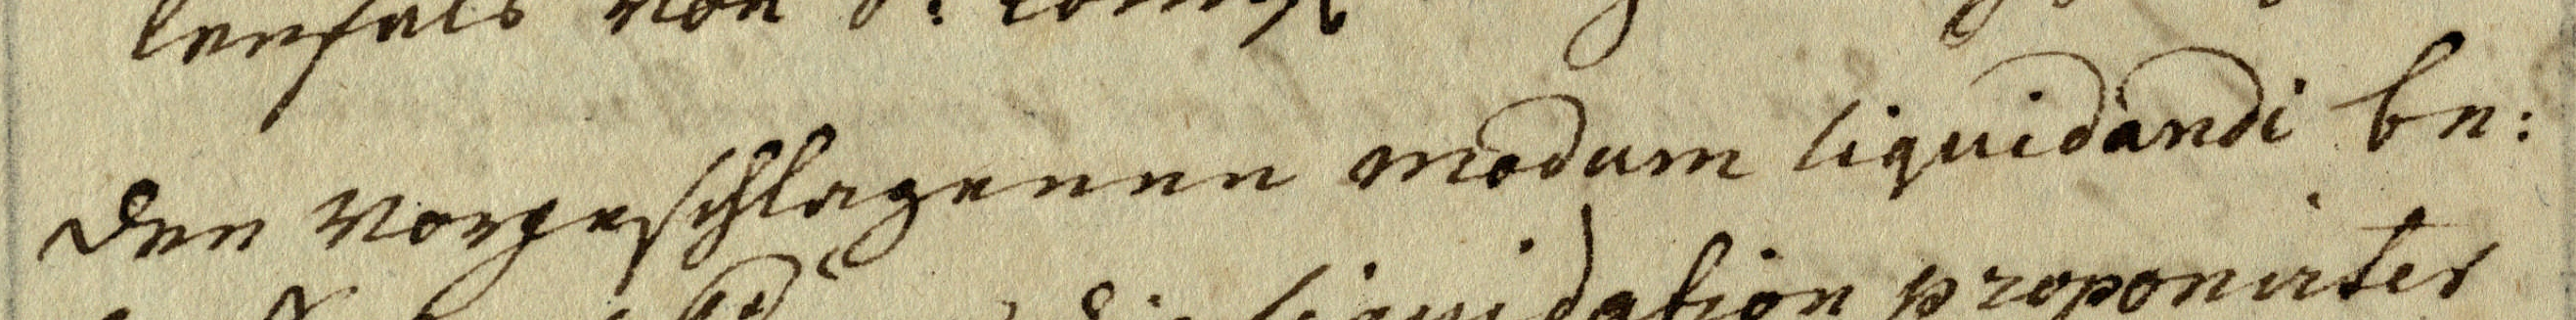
Den vorgeschlagenen modum liquidandi be¬
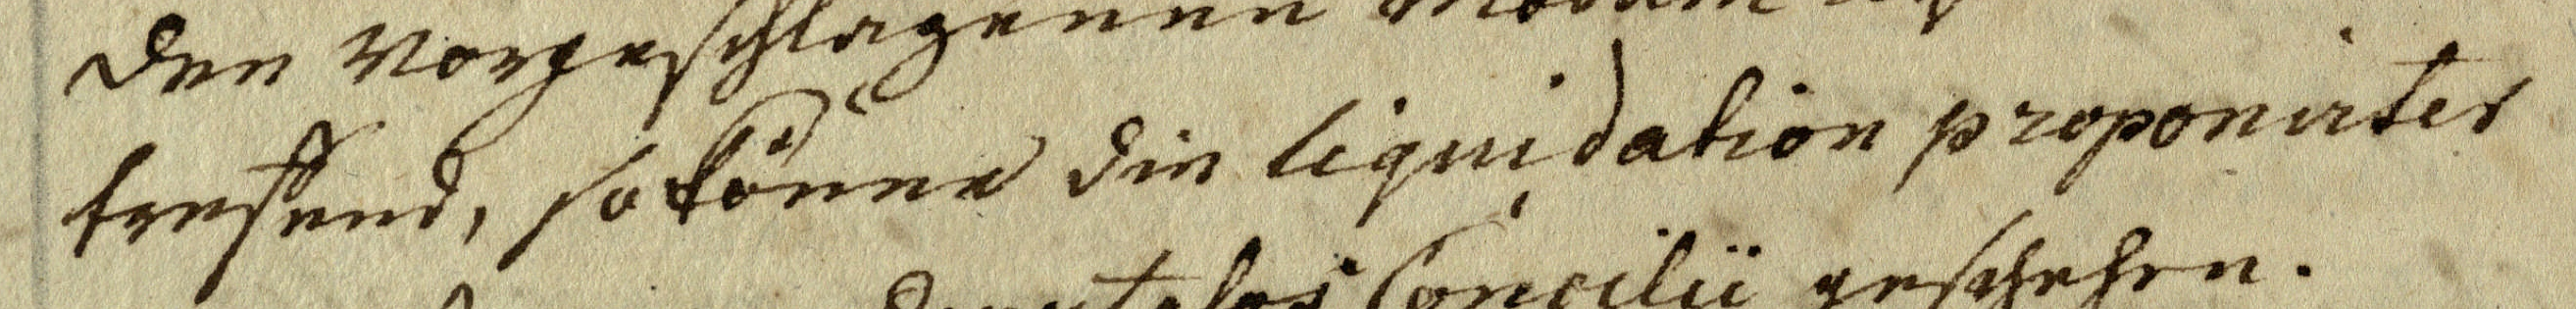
treffend, so könne die liquidation proponirter
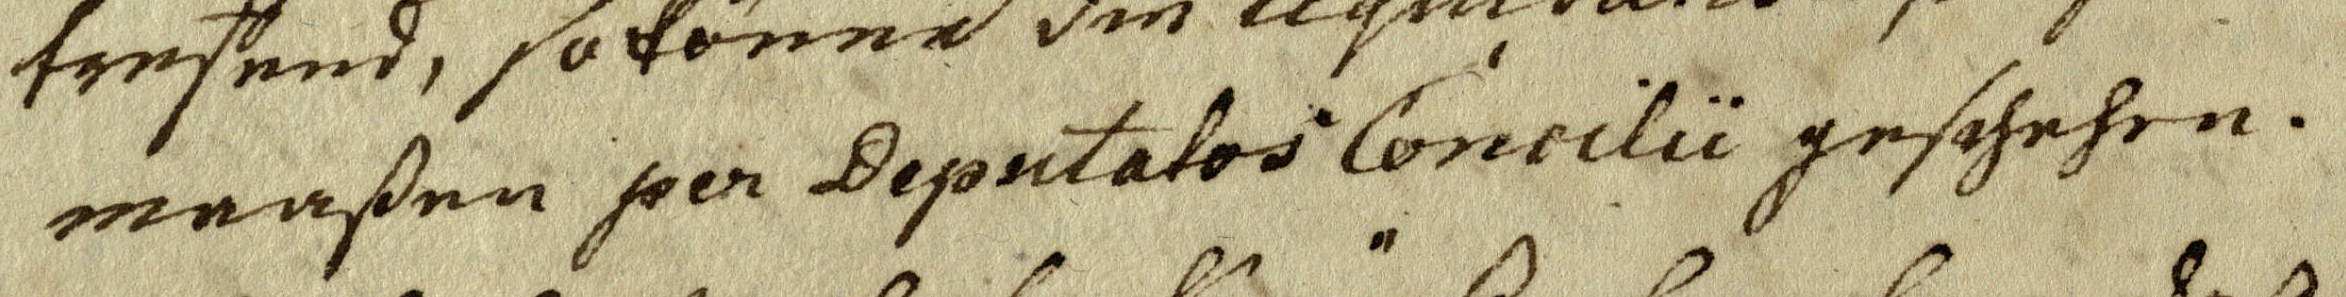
maaßen per Deputatos Concilii geschehen.
